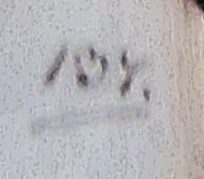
137.
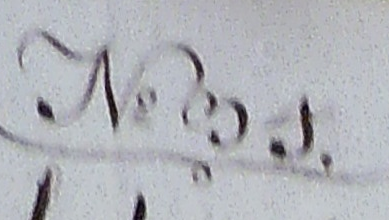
No͇ 35.
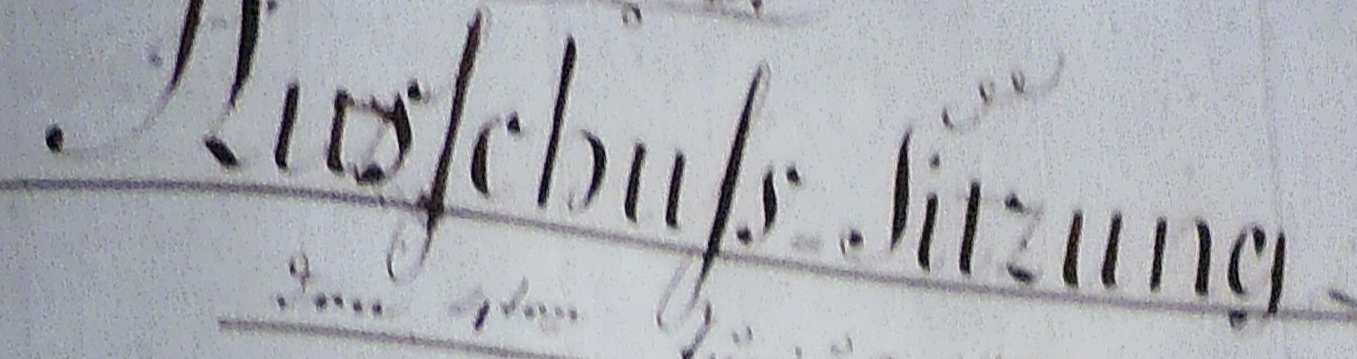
Ausschuss‗Sitzung.
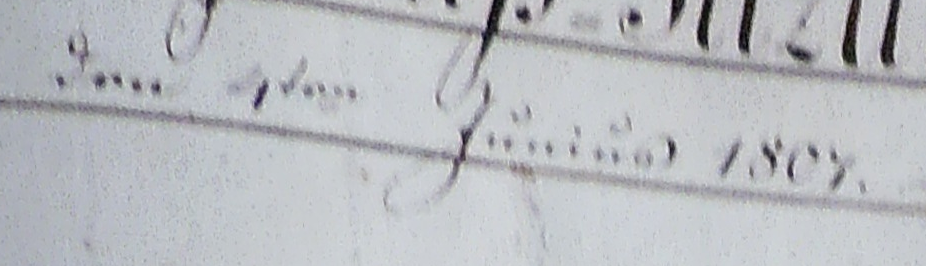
den 4te͇n Junius 1807.
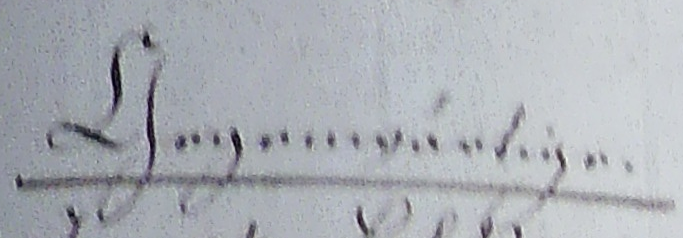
Gegenwärtige.
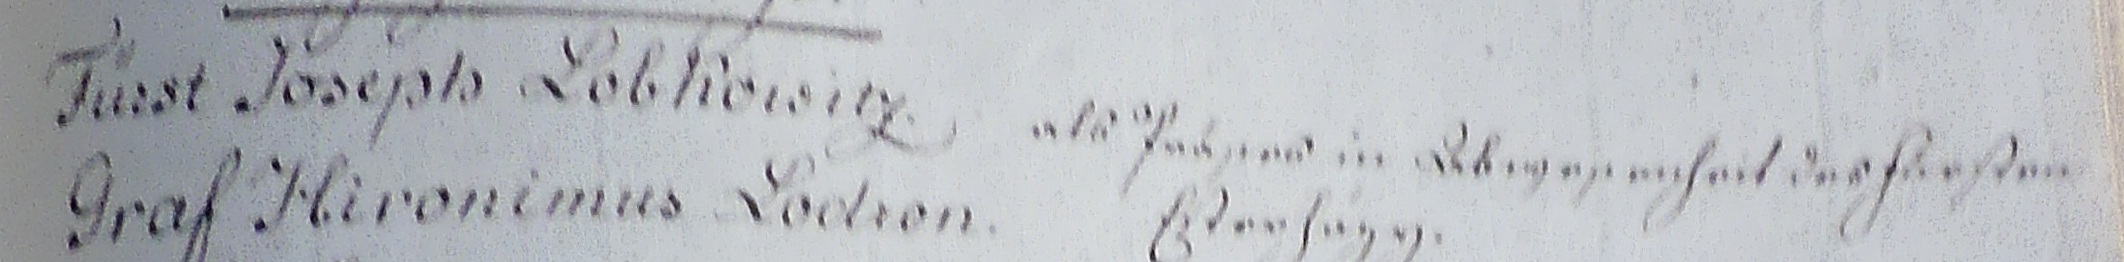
Fürst Joseph Lobkowitz, als Präses in Abwesenheit des Fürsten
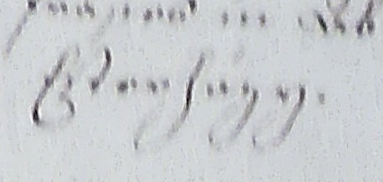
Esterházy.
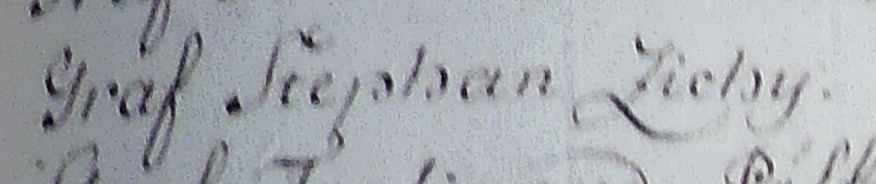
Graf Stephan Zichy.
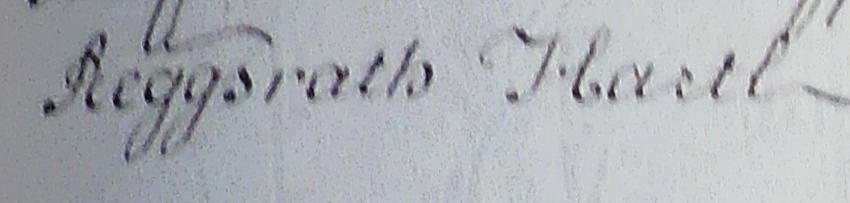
Reg͞gsrath Hartl.
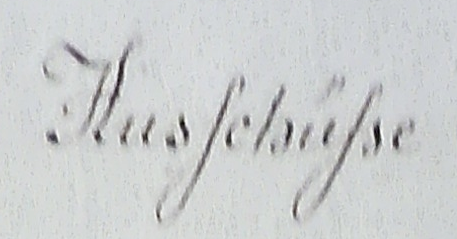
Ausschüsse
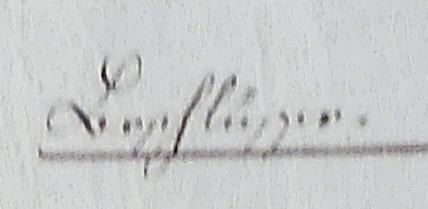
Beschlüsse.
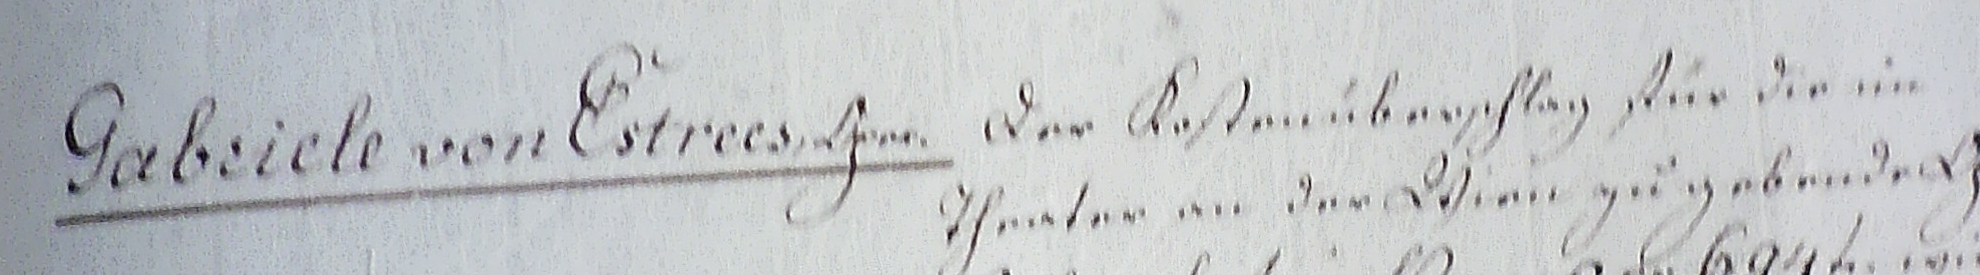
Gabriele von Estress, Oper. Der Kostenüberschlag für die im
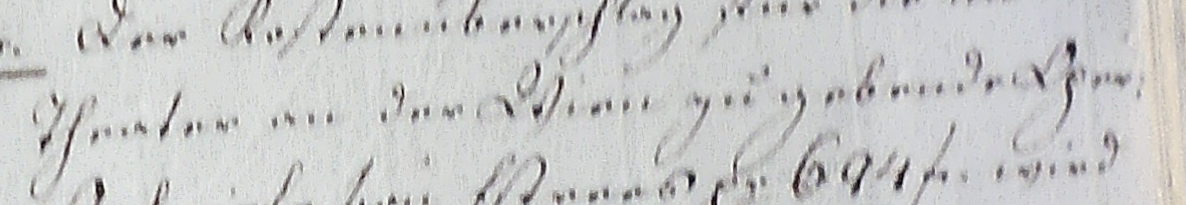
Theater an der Wien zu gebende Oper
